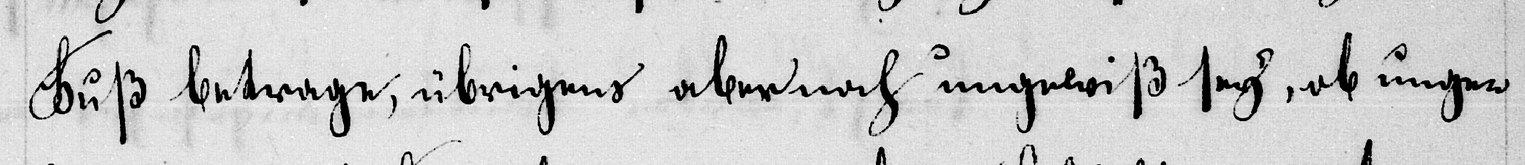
Fuß betrage, übrigens aber noch ungewiß sey, ob unge¬
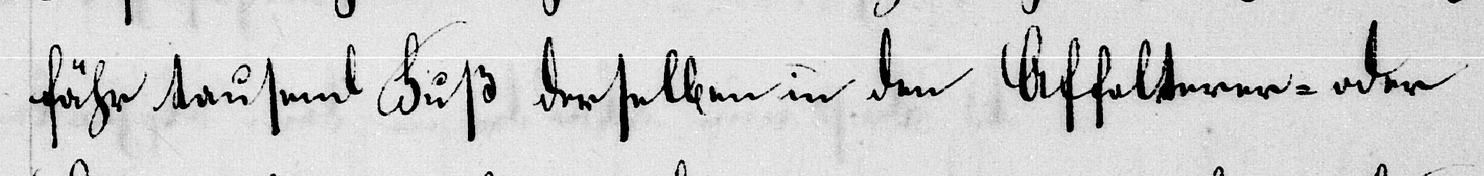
fähr tausend Fuß derselben in den Affolterer- oder
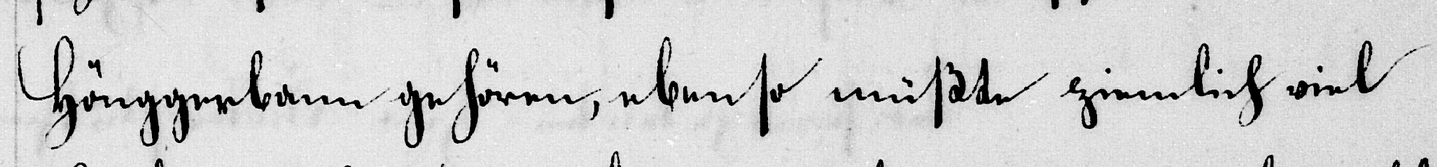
Hönggerbann gehören, ebenso müßte ziemlich viel
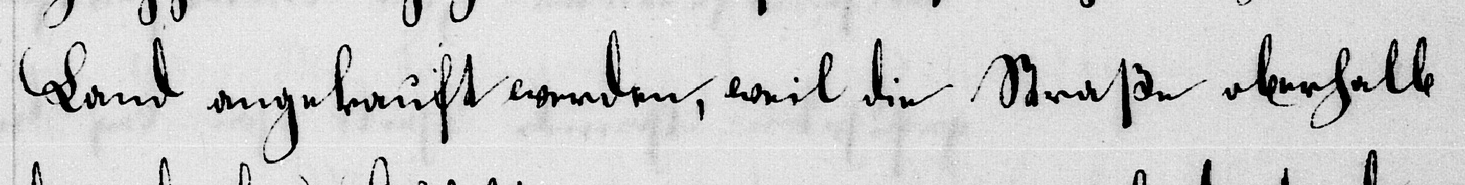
Land angekauft werden, weil die Straße oberhalb
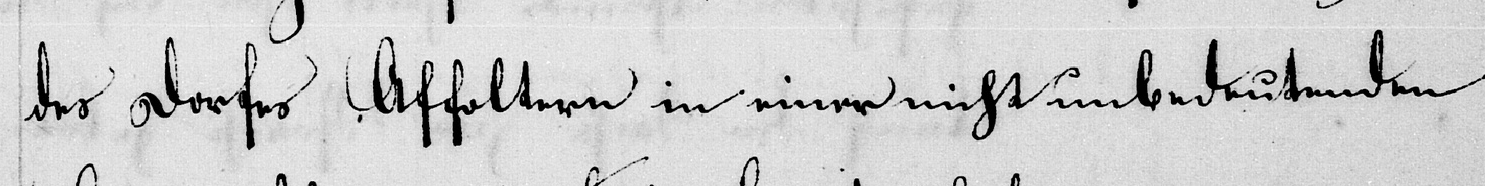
des Dorfes Affoltern in einer nicht unbedeutenden
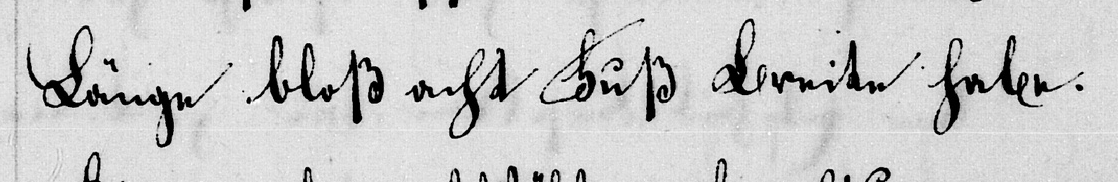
Länge bloß acht Fuß Breite habe.
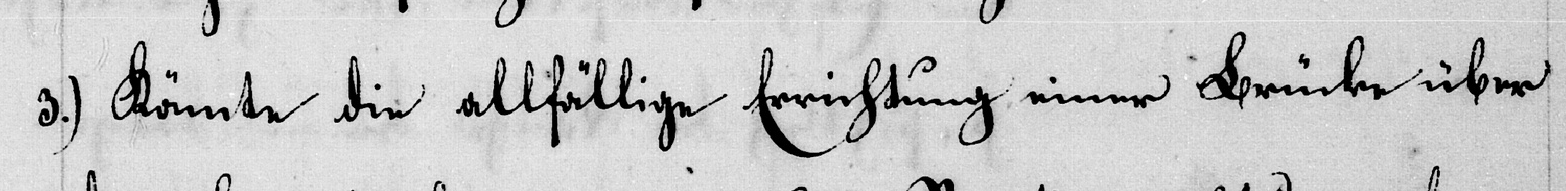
3.) Könnte die allfällige Errichtung einer Brücke über
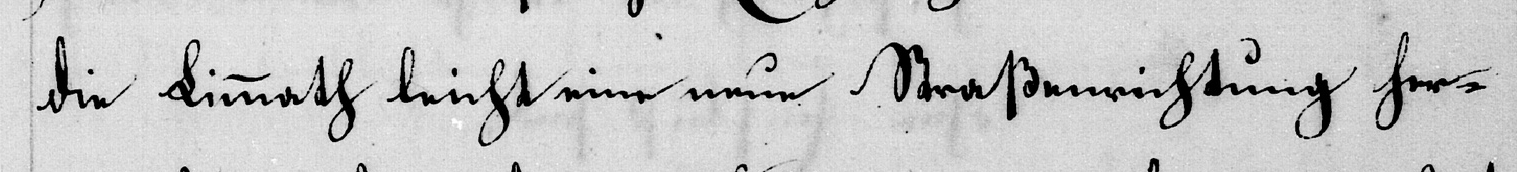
die Limmath leicht eine neue Straßenrichtung her¬
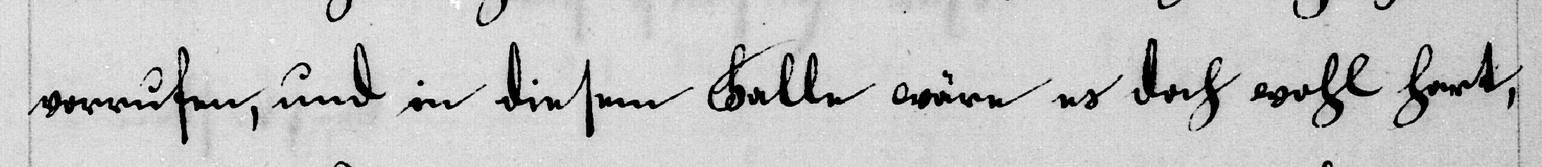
vorrufen, und in diesem Falle wäre es doch wohl hart,
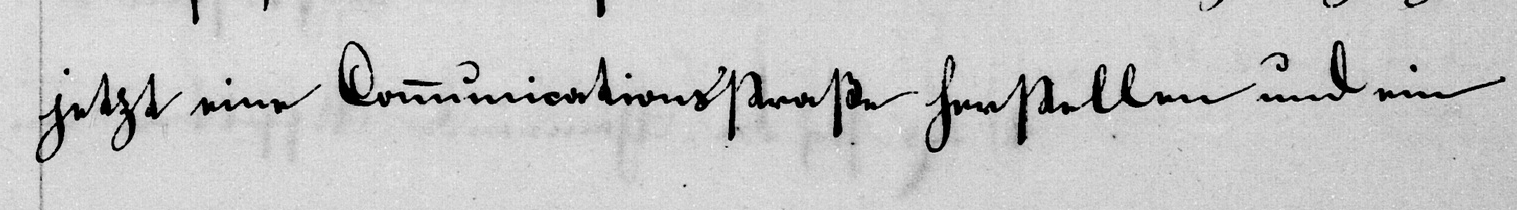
jetzt eine Communicationsstraße herstellen und ein
